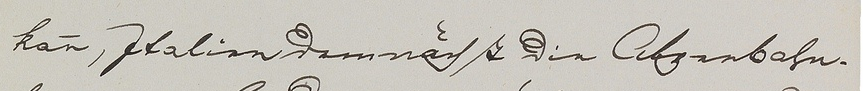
kann, Italien demnächst die Alpenbahn-
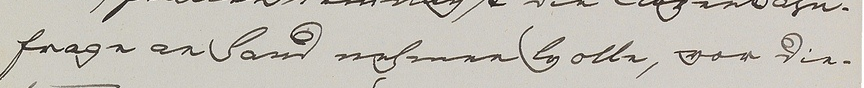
frage an Hand nehmen wolle, vor die-
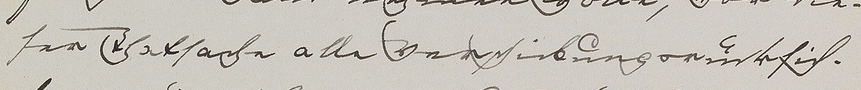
ser Thatsache alle Verschiebungsrücksich-
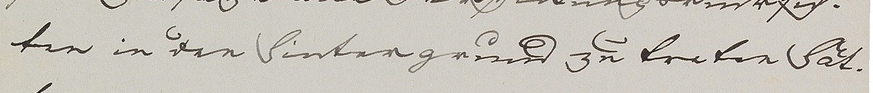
ten in den Hintergrund zu treten hät-
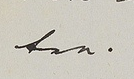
ten.
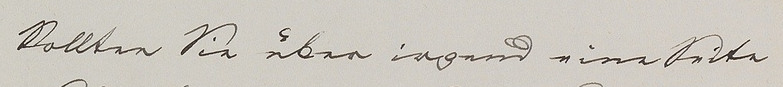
Sollten Sie über irgend eine Seite
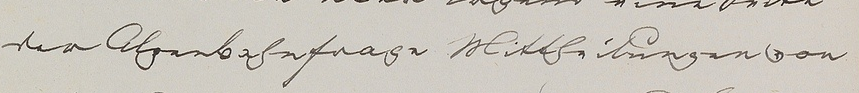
der Alpenbahnfrage Mittheilungen von
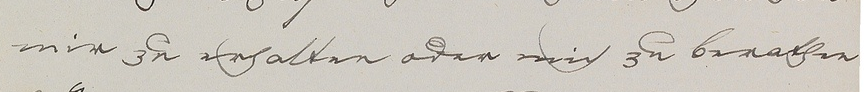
mir zu erhalten oder mich zu berathen
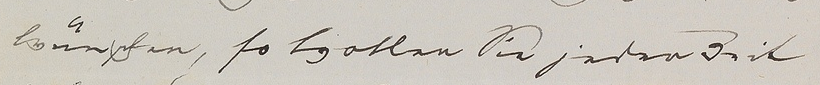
wünschen, so wollen Sie jeder Zeit
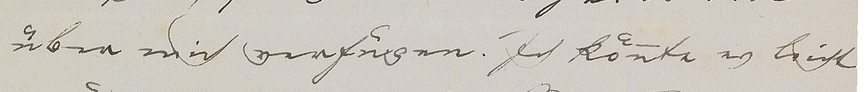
über mich verfügen. Ich könnte es leicht
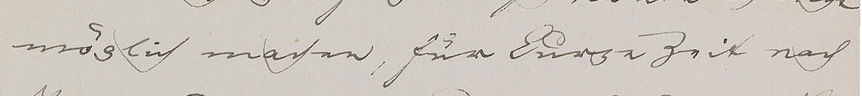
möglich machen, für kurze Zeit nach
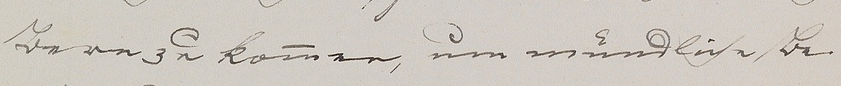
Bern zu kommen, um mündliche Be-
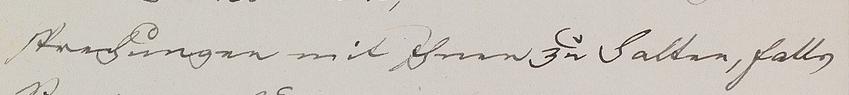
sprechungen mit Ihnen zu halten, falls
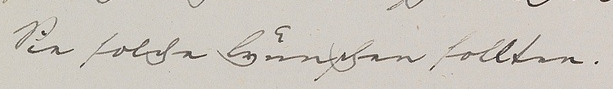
Sie solche wünschen sollten.
